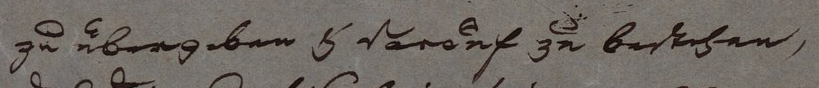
zu übergeben & darauf zu bestehen,
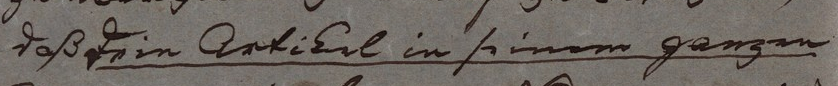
daß Dein Artikel in seinem ganzen
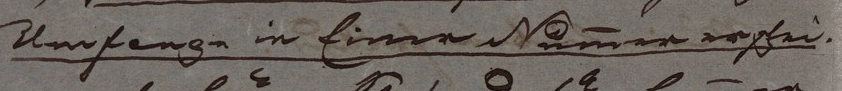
Umfange in Einer Nummer erschei-
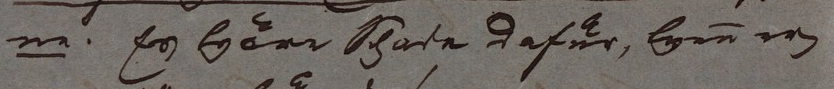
ne. Es wäre Schade dafür, wenn er
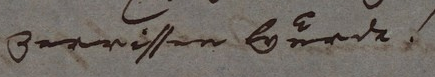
zerrissen würde!
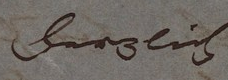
Herzlich
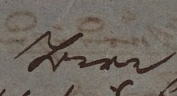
Escher
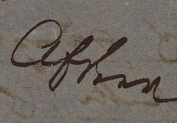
Bern
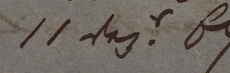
11. Dezr 67
